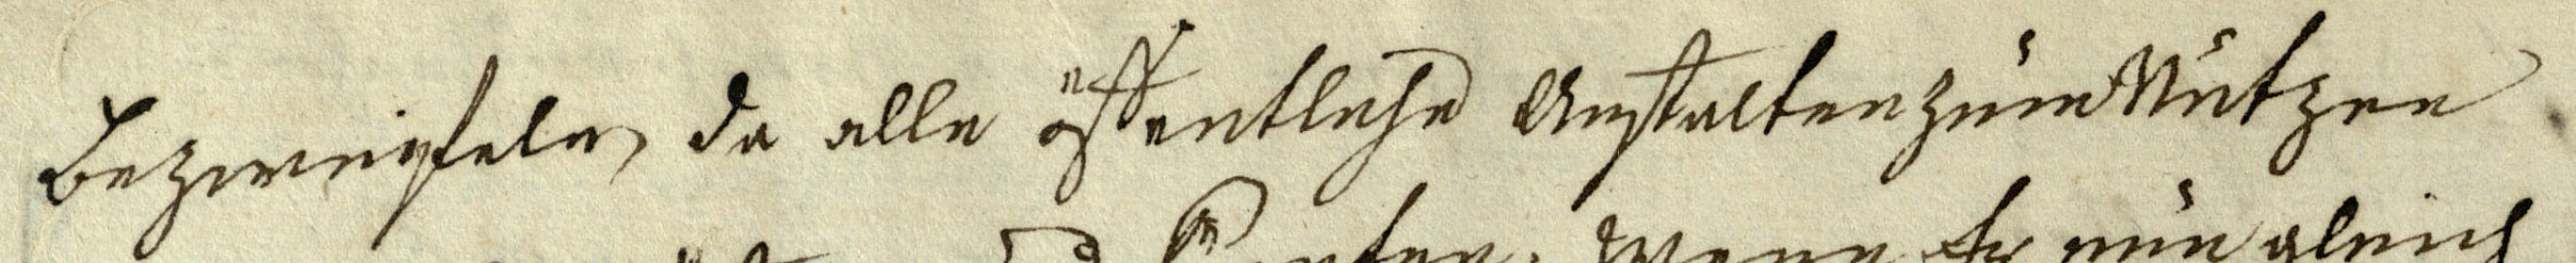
bezweifeln, da alle öffentliche Anstalten zum Nutzen
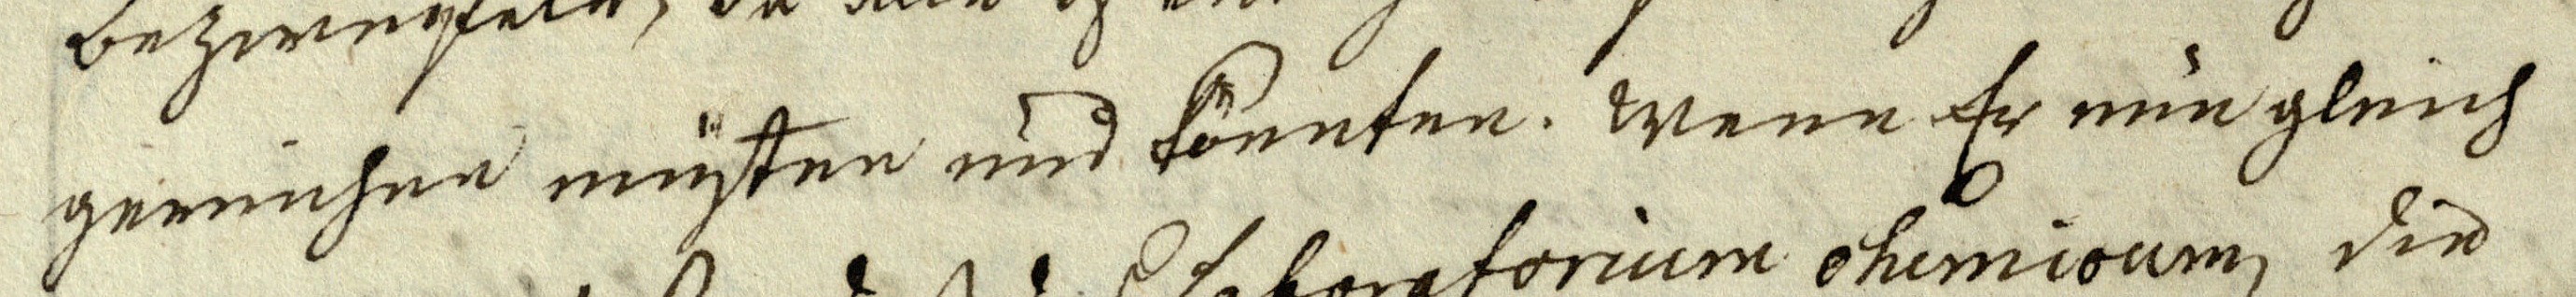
gereichen müsten und könnten. Wenn er nun gleich
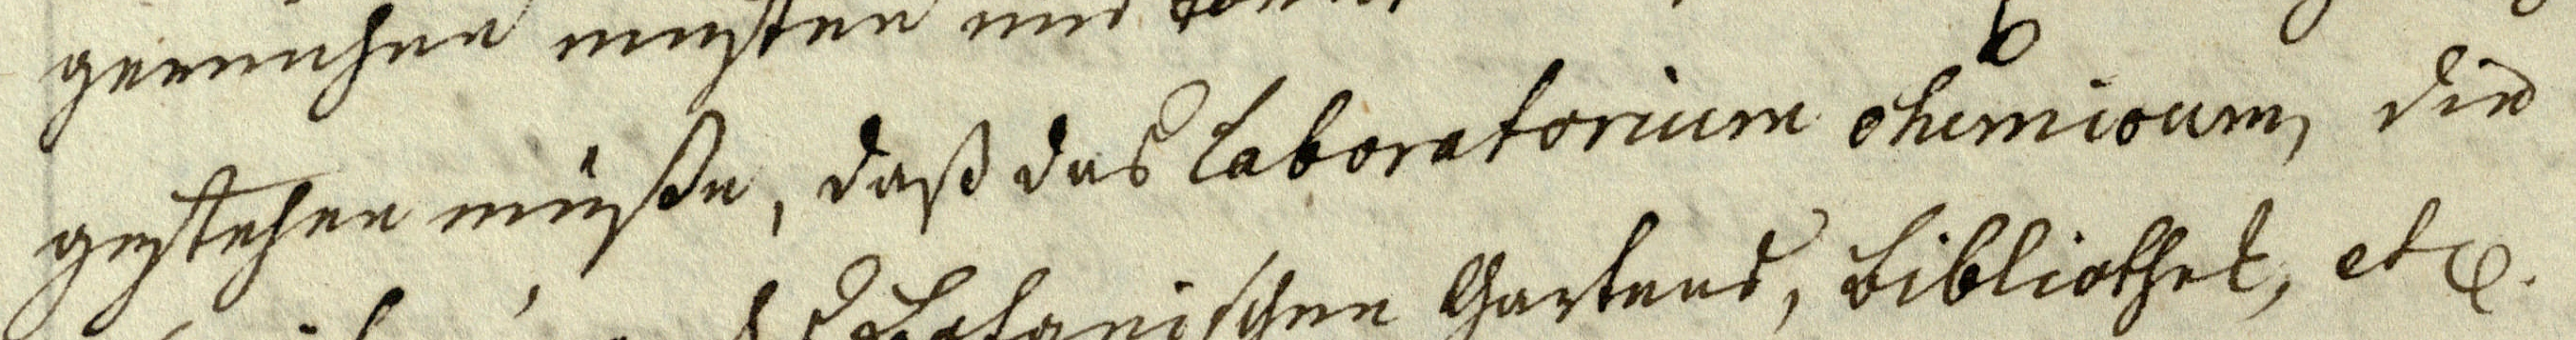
gestehen müße, daß das laboratorium chemicum, die
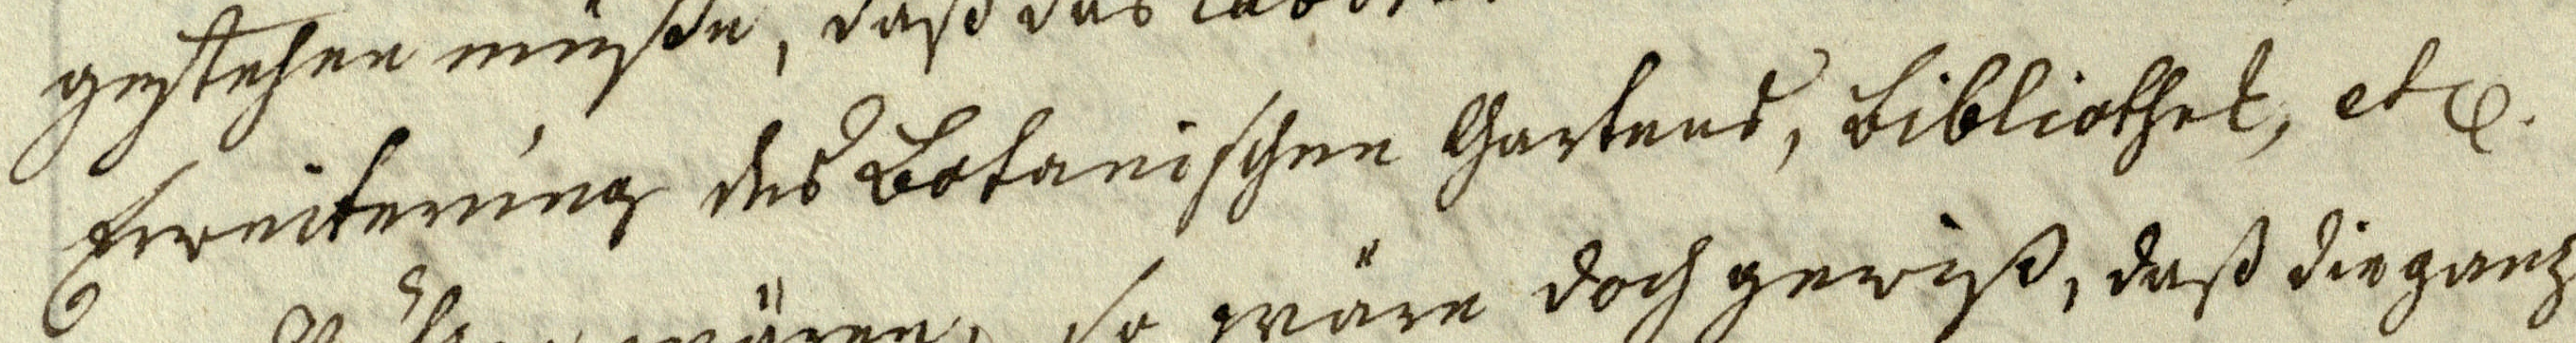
Erweiterung des Botanischen Gartens, Bibliothek, etc.
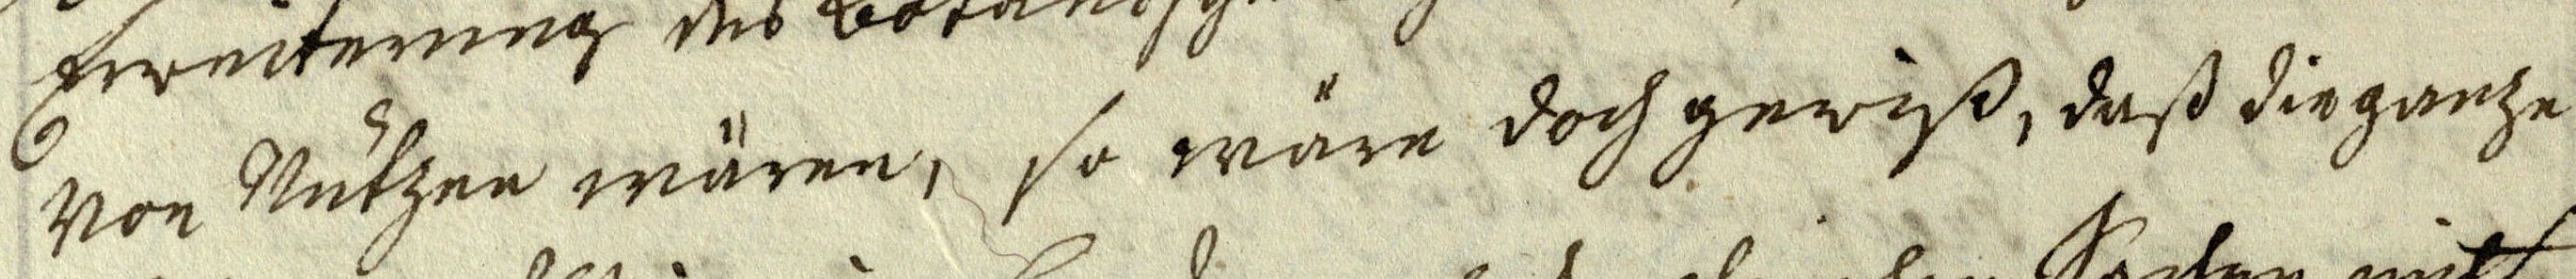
von Nutzen wären, so wäre doch gewiß, daß die ganze
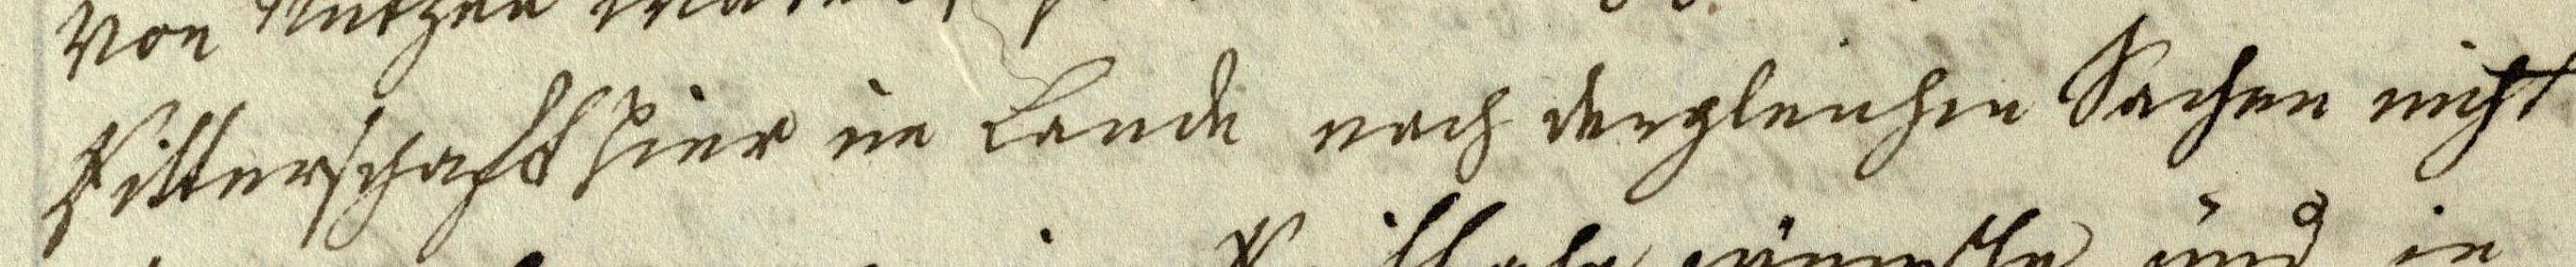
Ritterschaft hier im Lande nach dergleichen Sachen
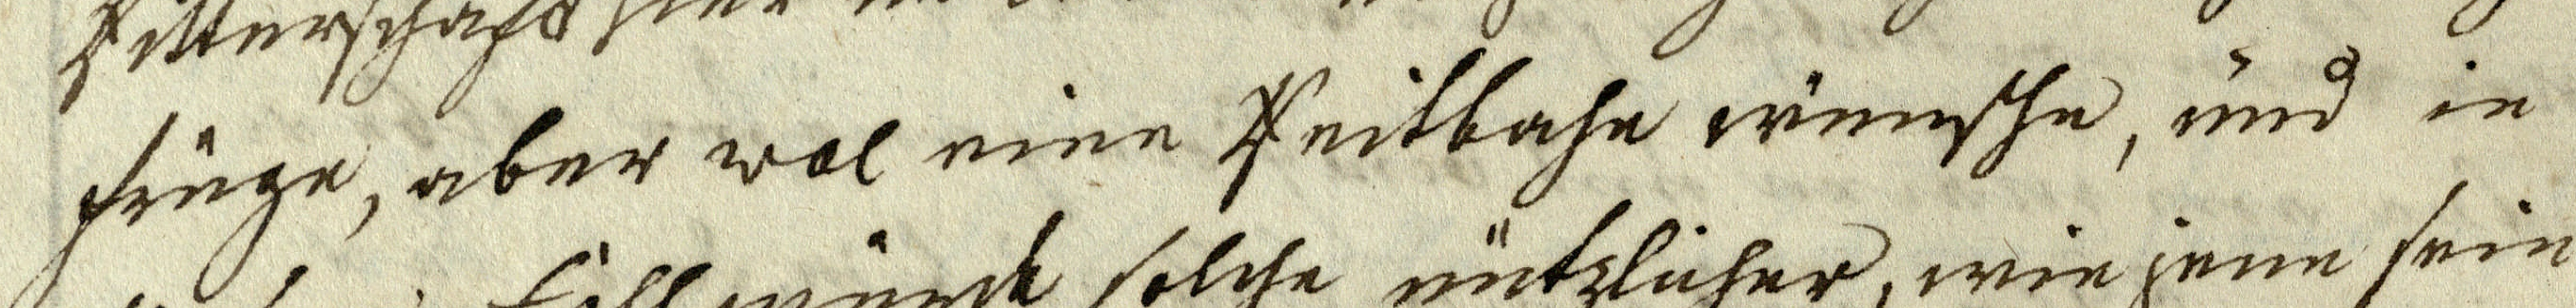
früge, aber wol eine Reitbahn wünsche, und in
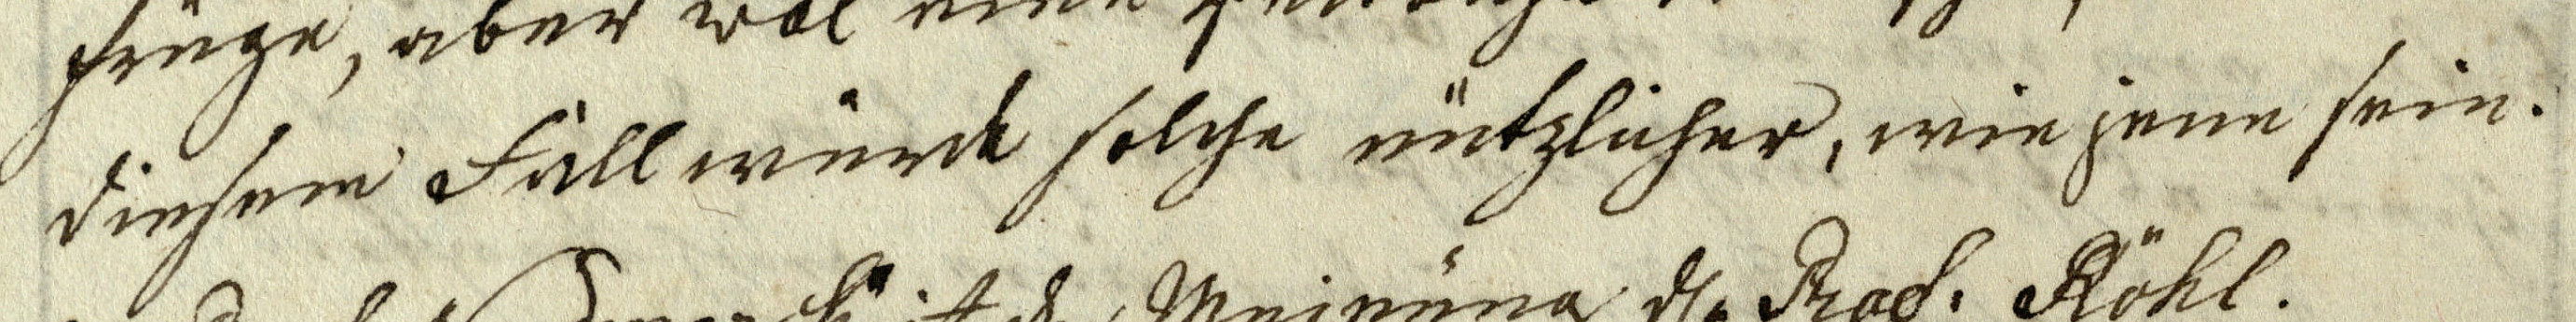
diesem Fall würde solche nützlicher, wie jene sein.
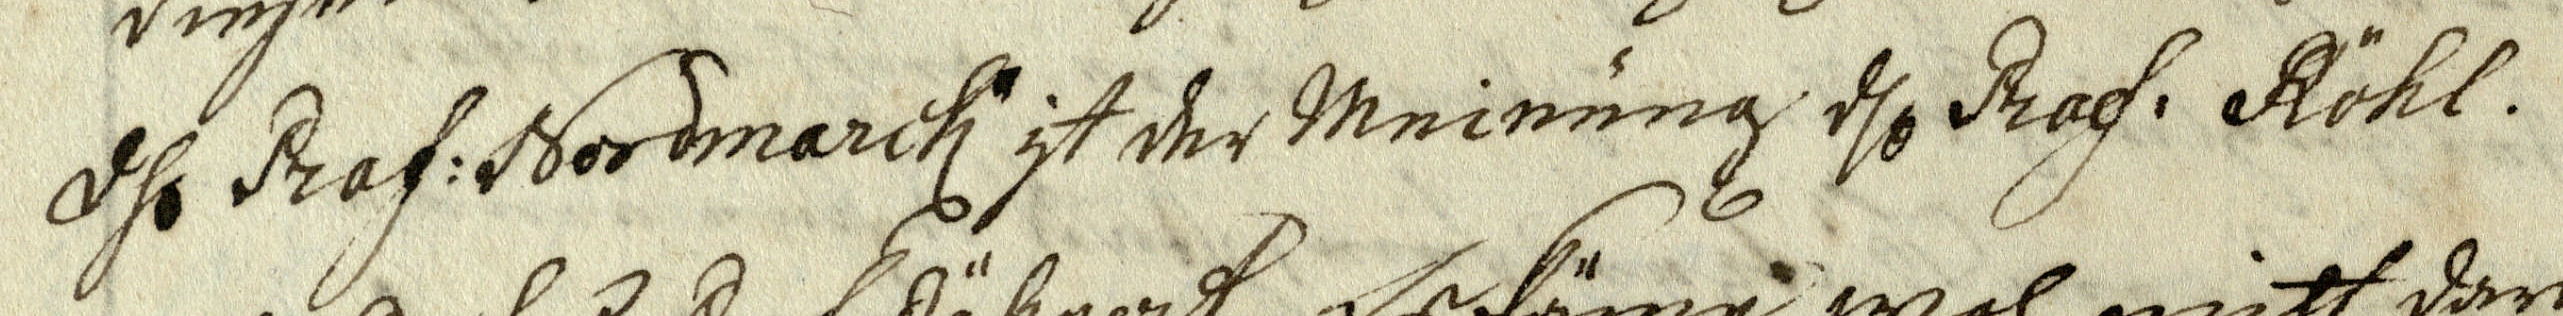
dh Prof. Nordmarck ist der Meinung dh Prof. Röhl.
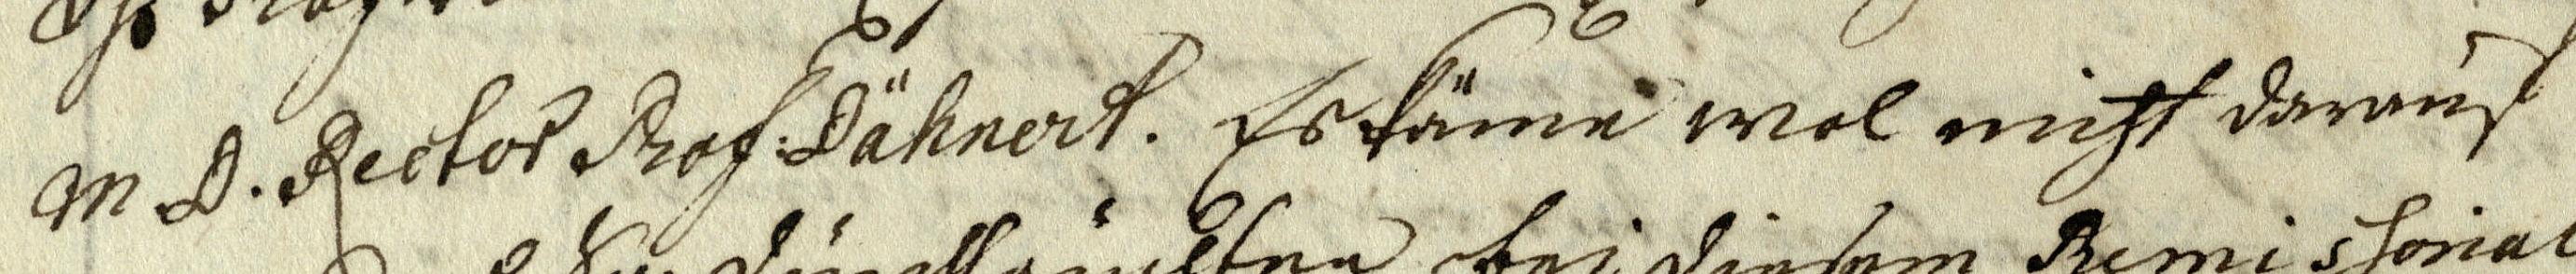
M. D. Rector Prof. Dähnert. Es käme wol nicht darauf
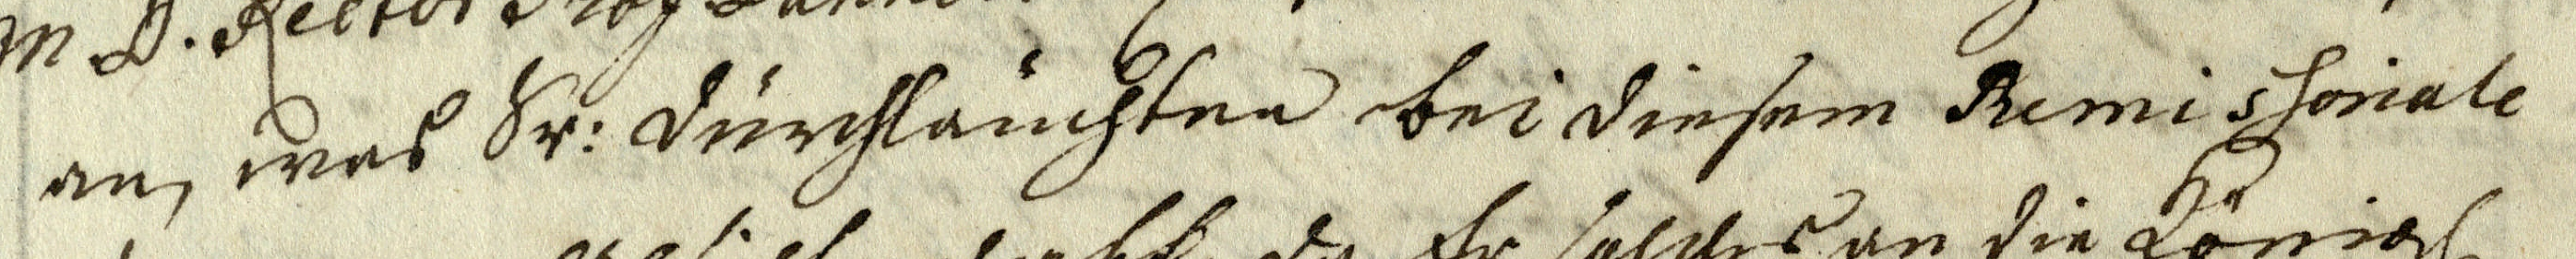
an, was Sr. Durchlauchten bei diesem Remissoriale
